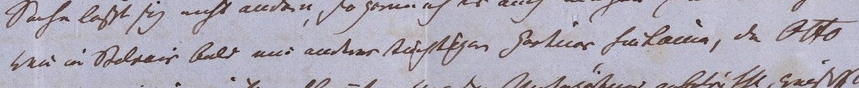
wenn in Belvoir bald ein andrer tüchtiger Gärtner hinkäme, da Otto
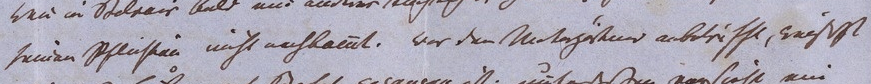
seinen Pflichten nicht nachkommt. Was den Untergärtner anbetrifft, weißst
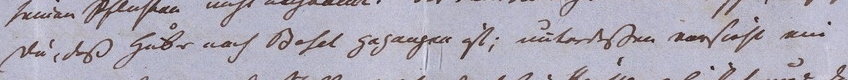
Du, daß Hubs nach Basel gegangen ist; unterdeßen versieht ein
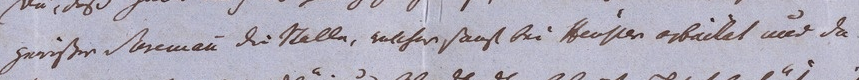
gewißer Dosemann die Stelle, welcher sonst bei Heusser arbeitet und da
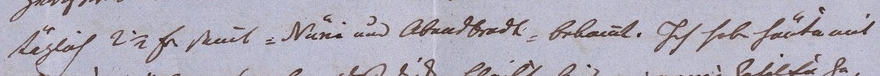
täglich 2 ½ Fr. sammt «Nüni und Abendbrodt» bekommt. Ich habe heute mit
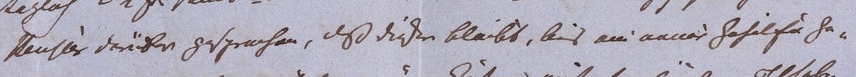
Heusser darüber gesprochen, daß dieser bleibt, bis ein neuer Gehilfe ge-
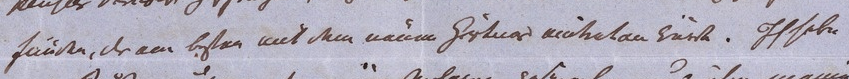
funden, der am besten mit dem neuen Gärtner eintreten würde. Ich habe
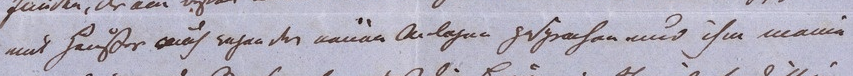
mit Heußer auch wegen den neuen Anlagen gesprochen und ihm meine
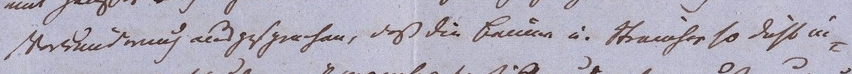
Verwunderung ausgesprochen, daß die Bäume u. Sträucher so dicht in-
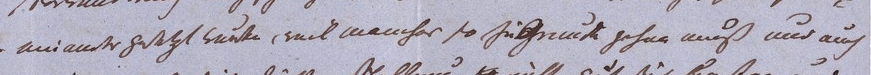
einander gesetzt wurden, weil manches so zu Grunde gehen muß und auch
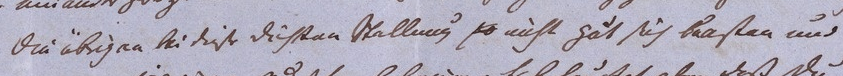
die übrigen bei dieser dichten Stallung nicht gut sich beasten und
